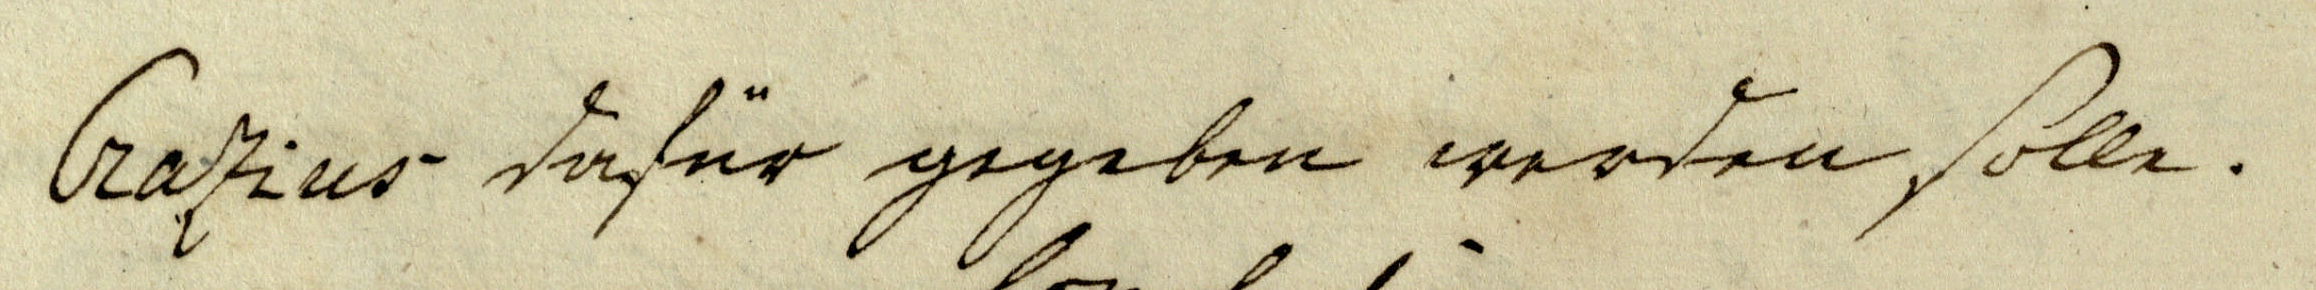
Crazius dafür gegeben werden solle.
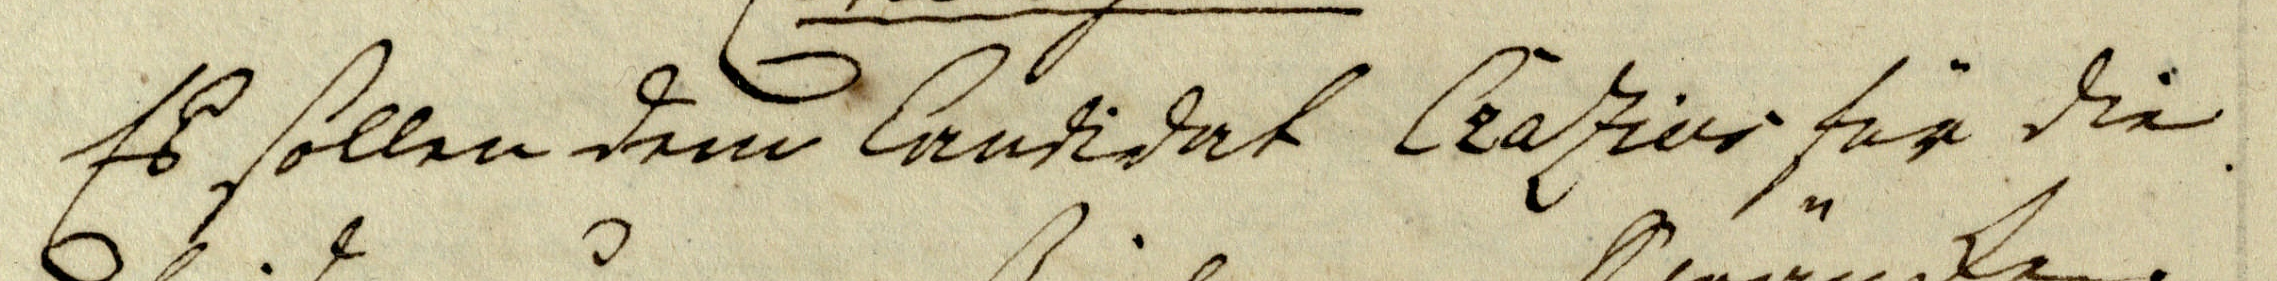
Es sollen dem Candidat Crazius für die
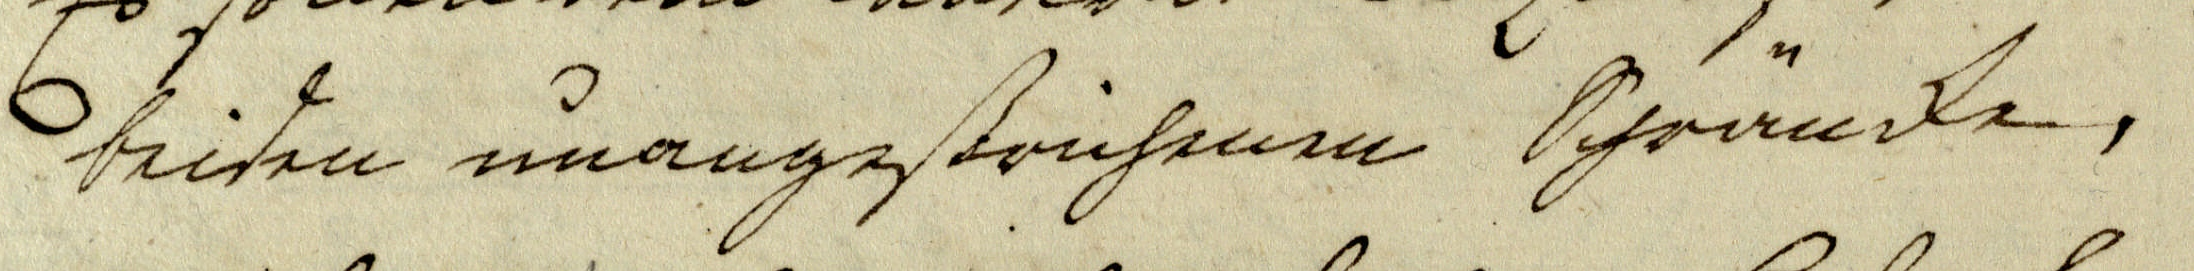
beiden unangestrichenen Schräncke,
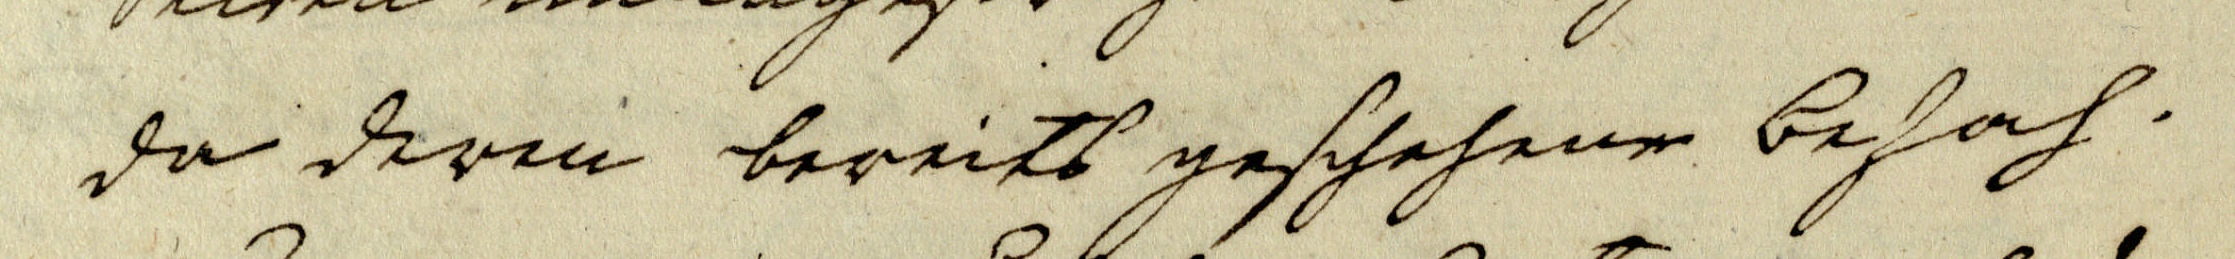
da deren bereits geschehene Bezah¬
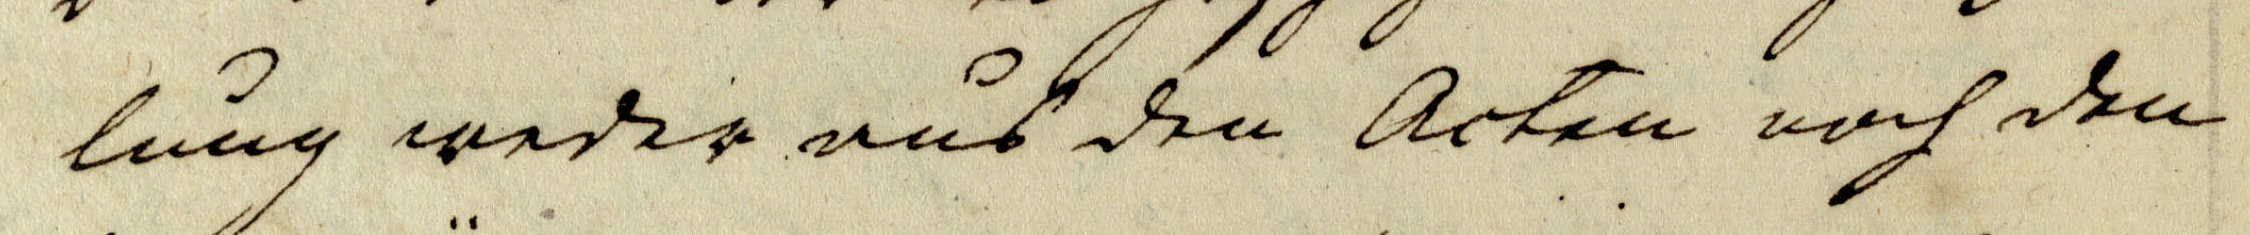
lung weder aus den Acten noch den
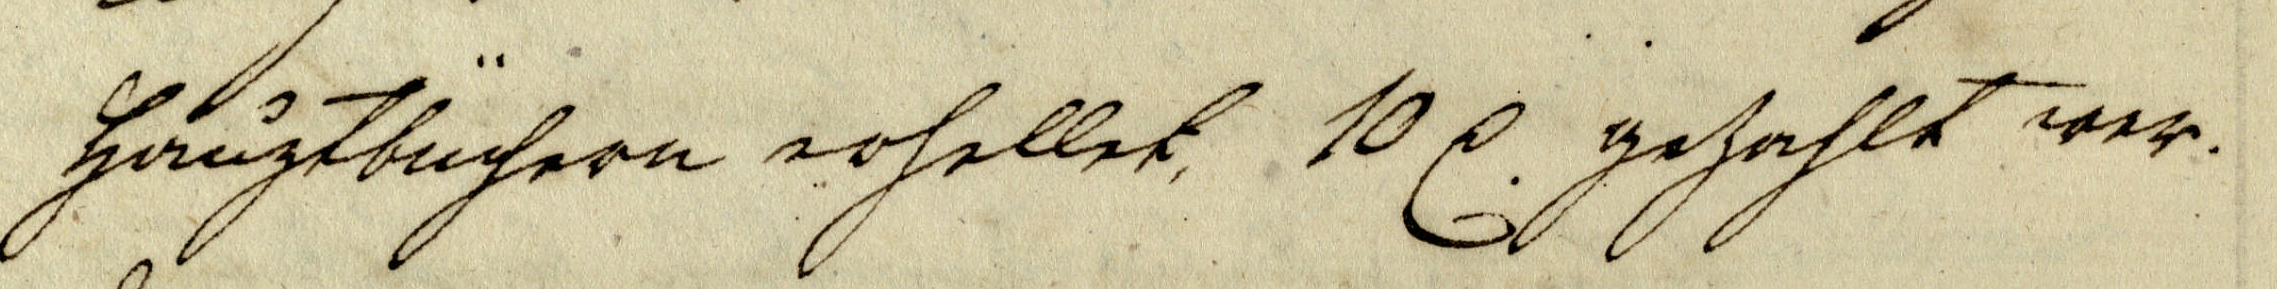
Hauptbüchern erhellet, 10 l. gezahlt wer¬
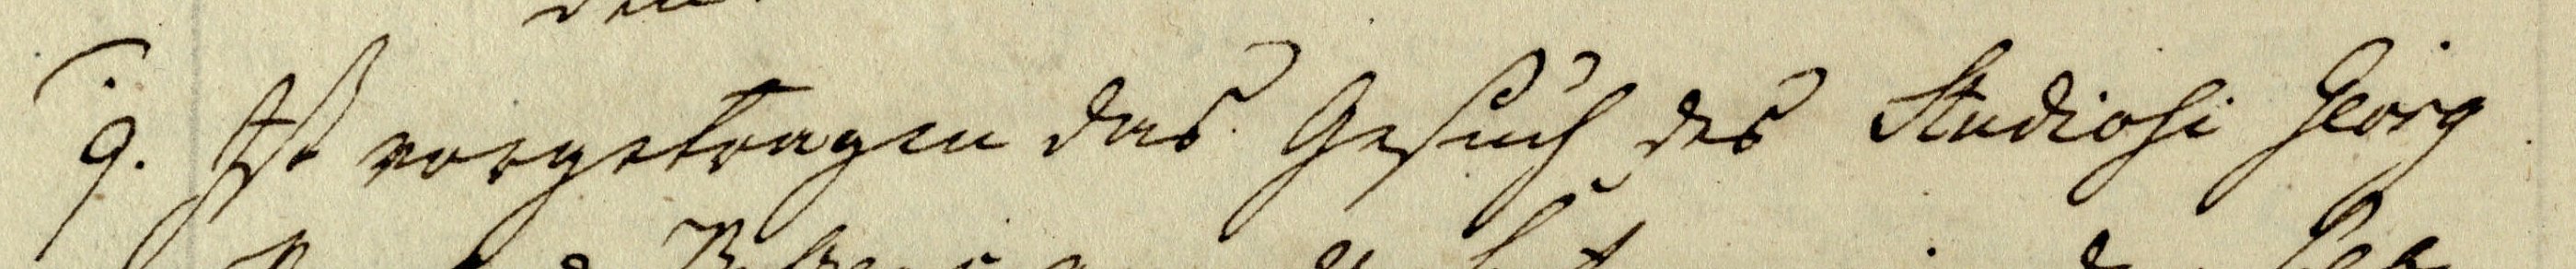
9. Ist vorgetragen das Gesuch des Studiosi Georg
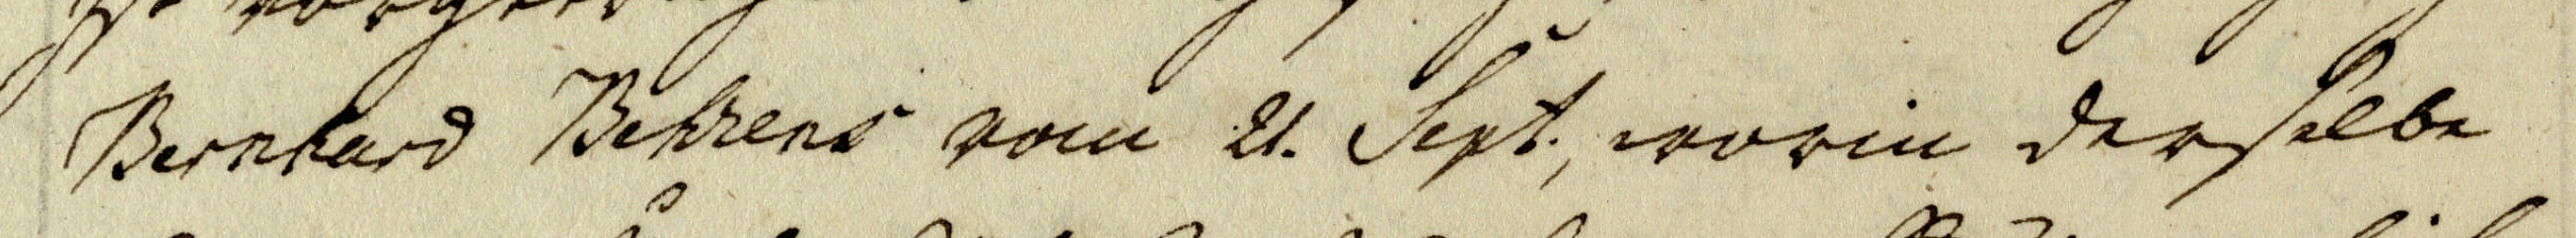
Bernhard Behrens vom 21. Sept., worin derselbe
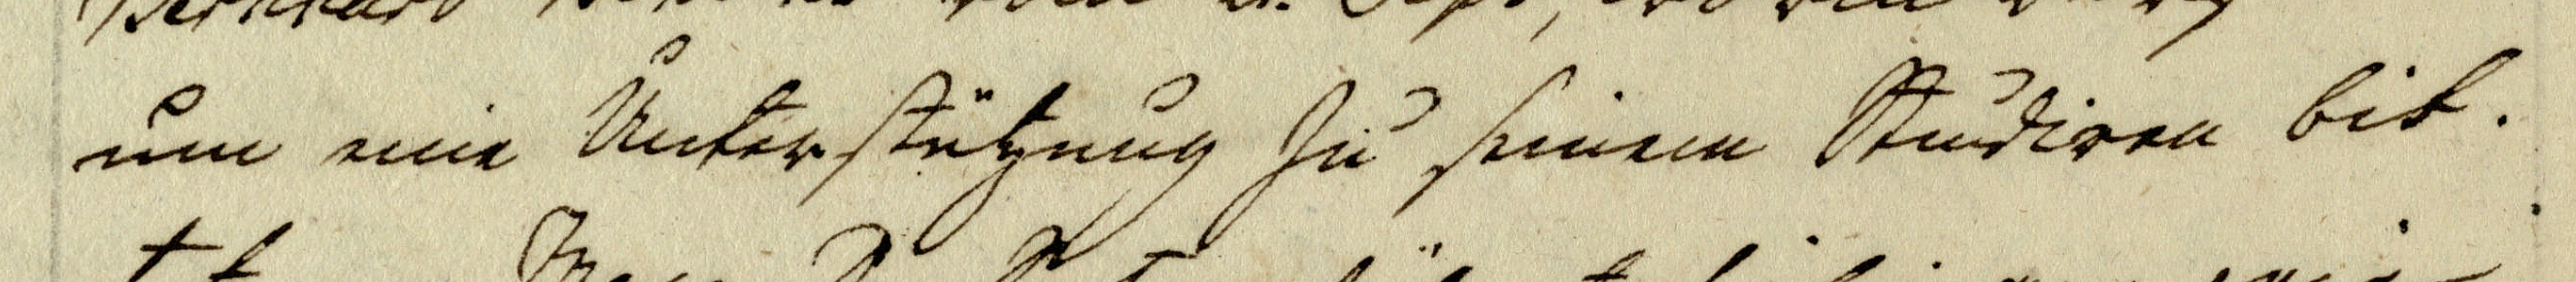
um eine Unterstützung zu seinem Studiren bit¬
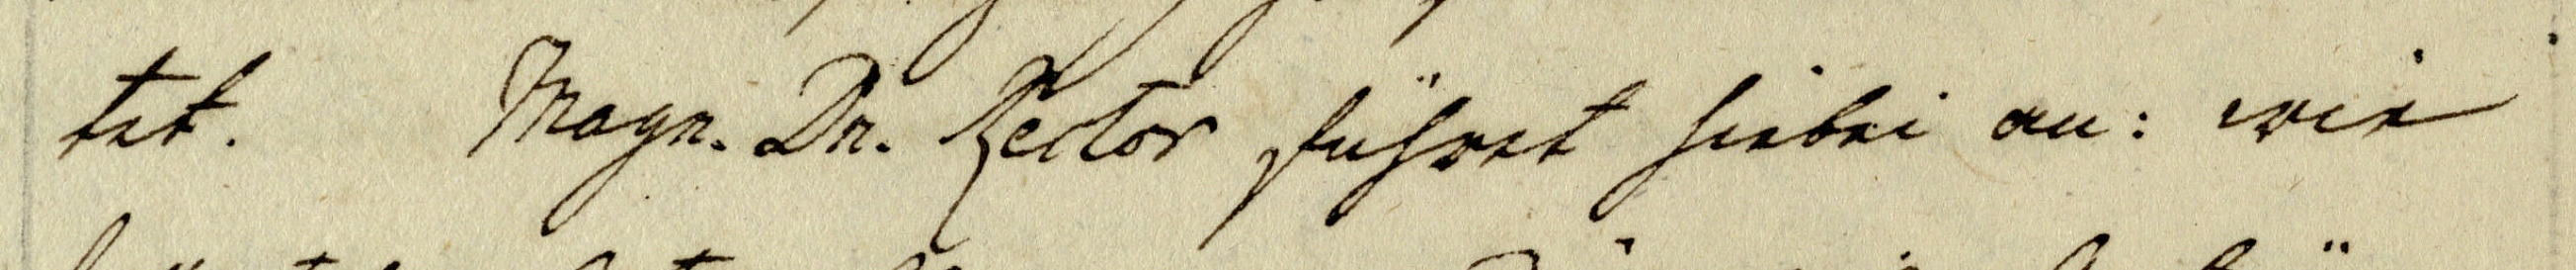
tet. Magn. Dn. Rector führet hiebei an: wie
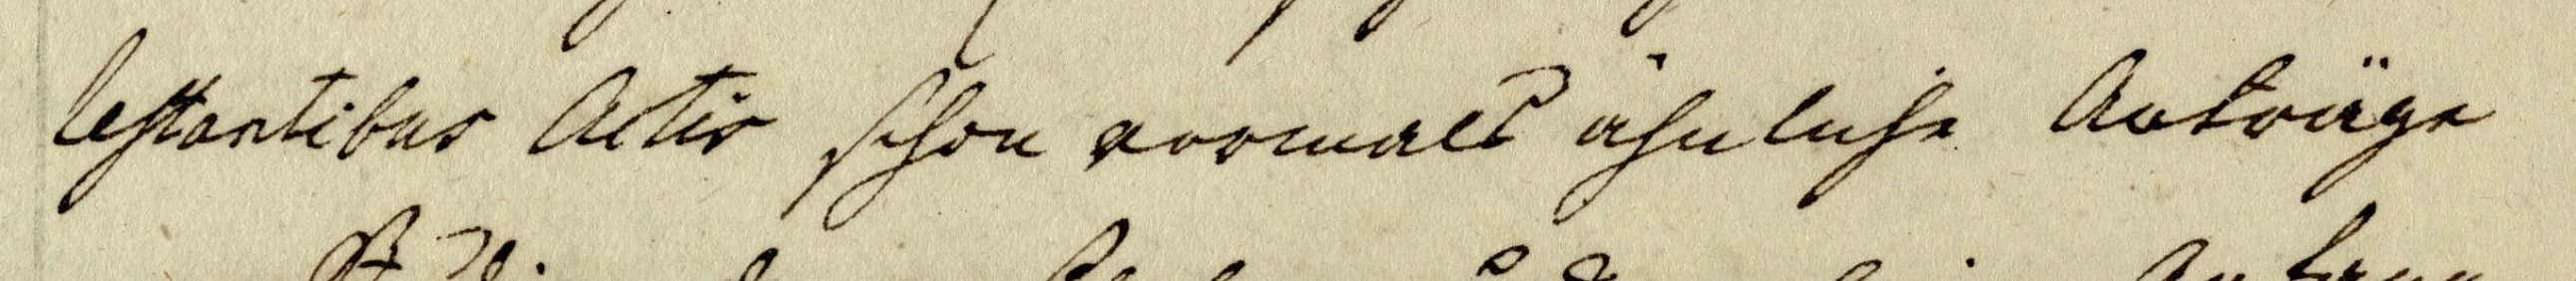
testantibus Actis schon vormals ähnliche Anträge
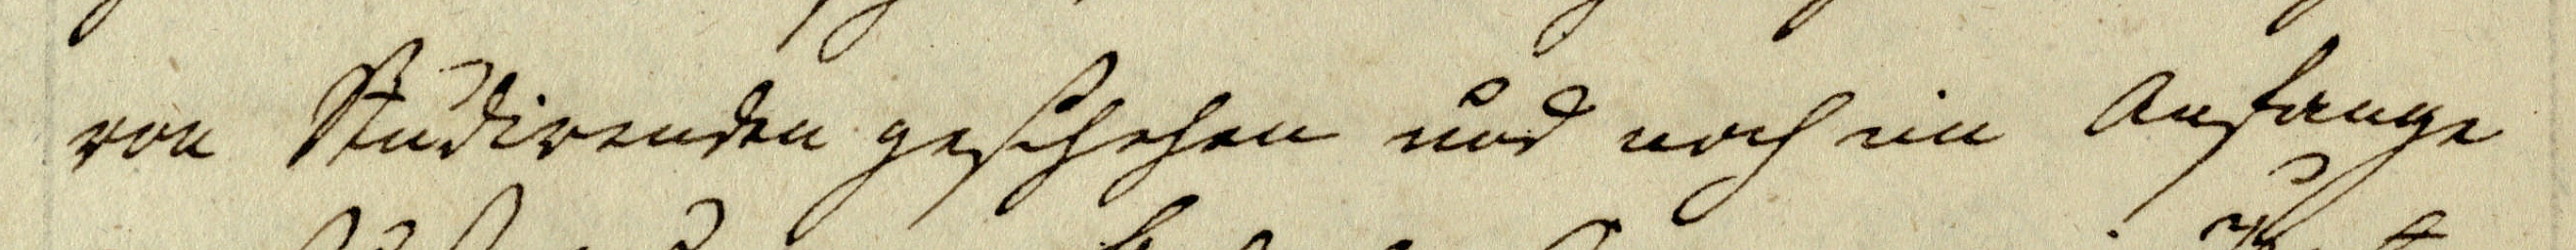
von Studirenden geschehen und noch im Anfange
